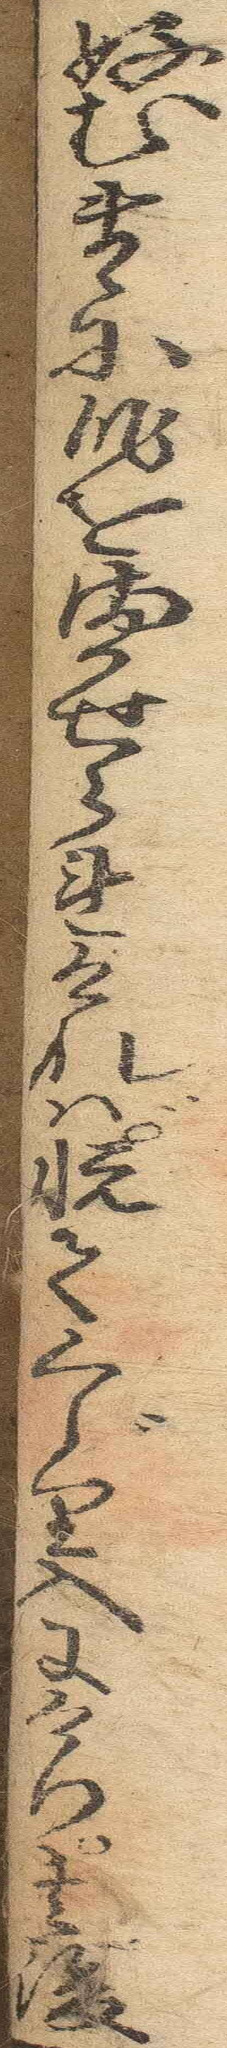好むまゝに身をまかせられければ。悦てくじり入にけり。其後
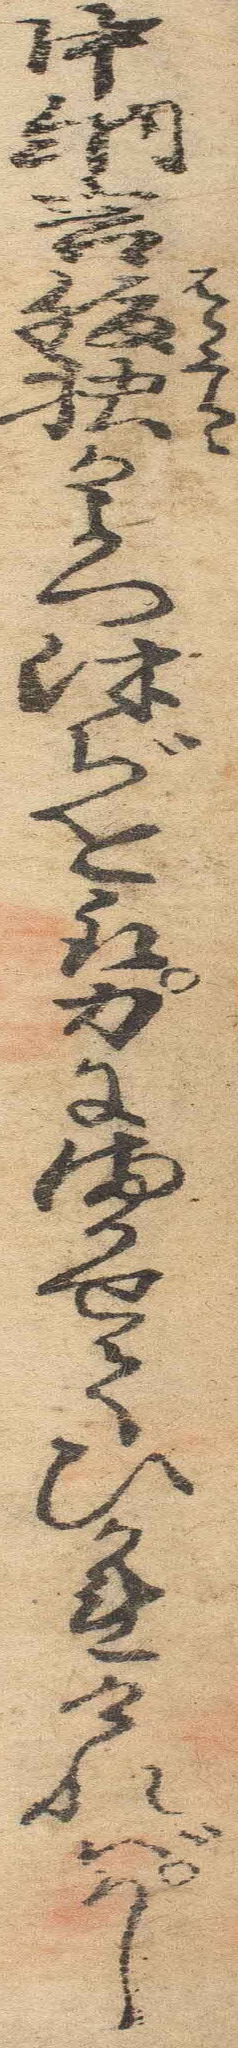中納言腹袂かよつつぢを取。力にまかせてひかれければ。かし
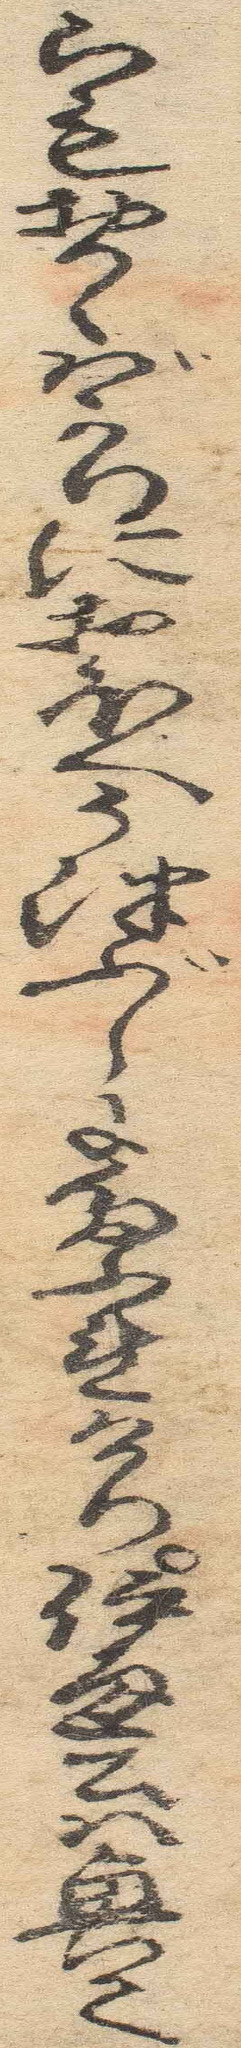らもおるゝばかりにおほへうつぶしにたふれけり。伊通公は興さ
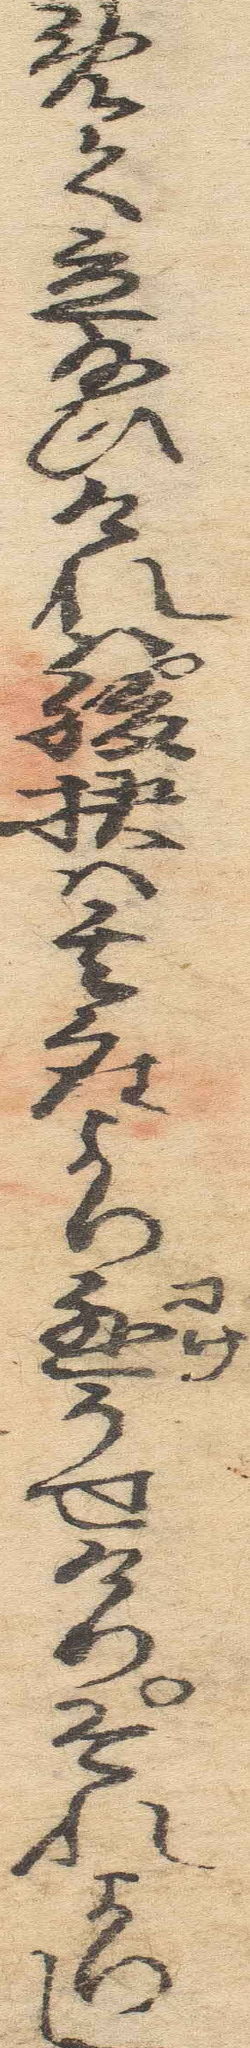めて立給ひければ腹くじりは其座より逃うせけり。それよりし
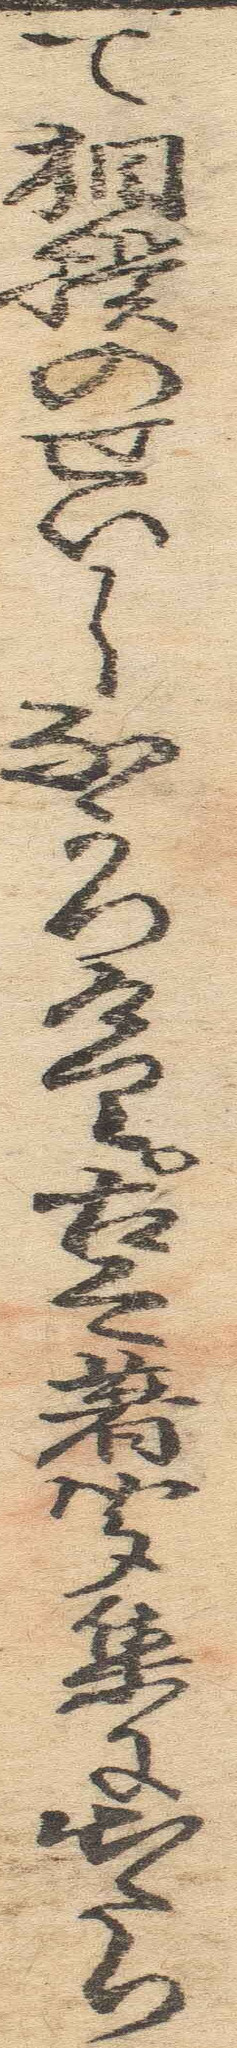て相撲のせいしなかりけり。古今著聞集に出たり。
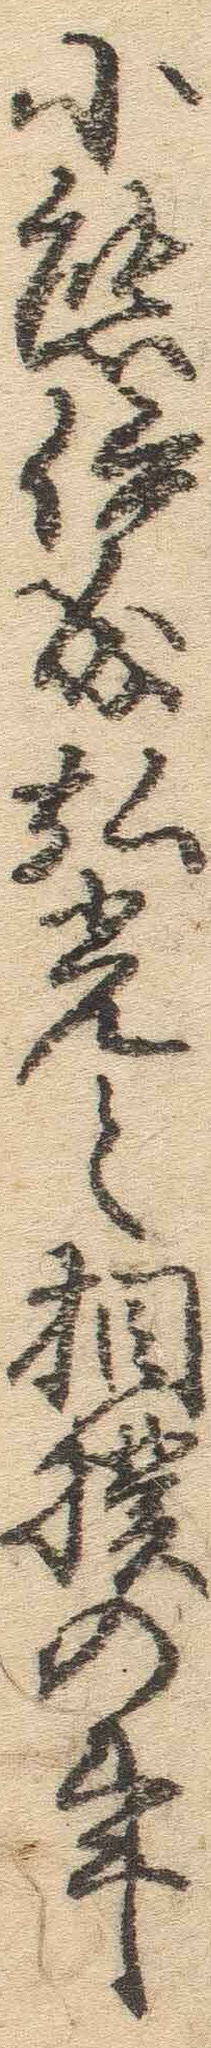小熊伊成弘光と相撲の事
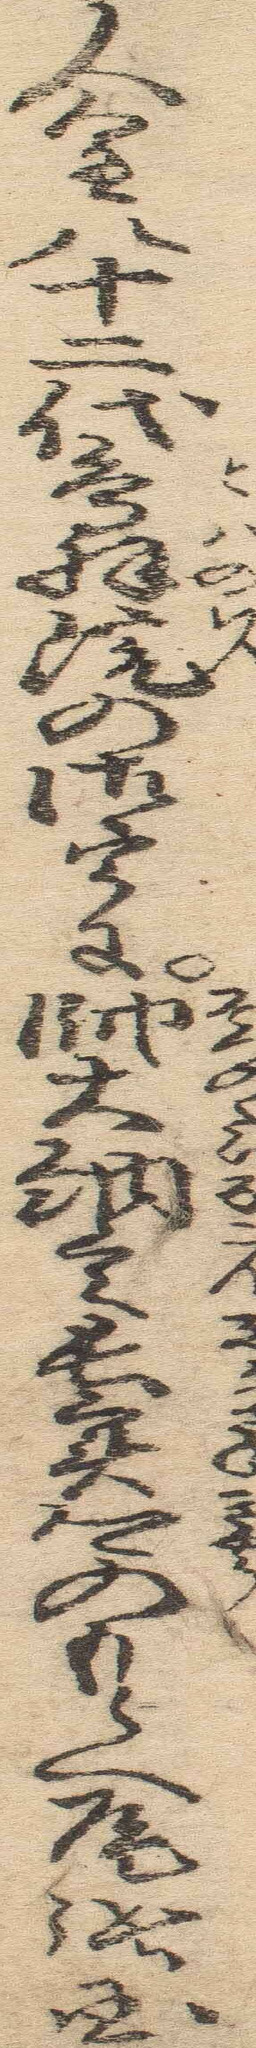人皇八十二代鳥羽院の御宇に。帥大納言長実卿のもとへ尾張国
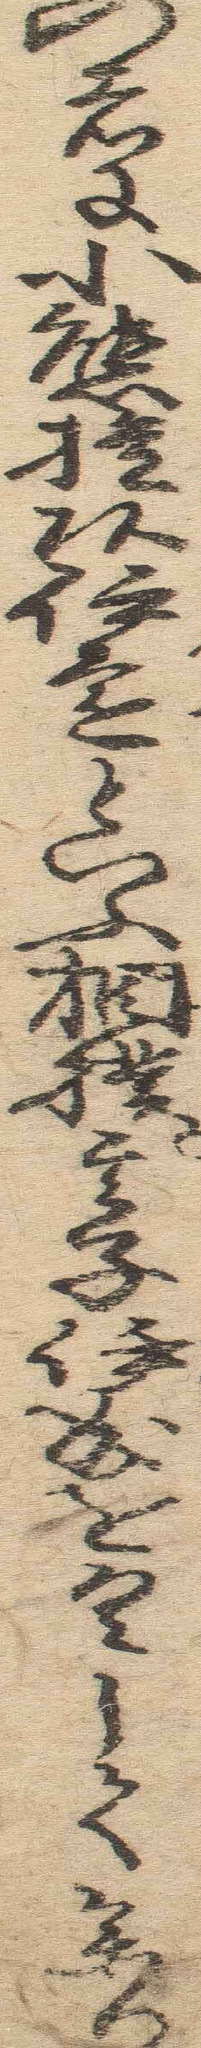の者に小熊権頭伊遠といふ相撲。其子伊成を具して参り
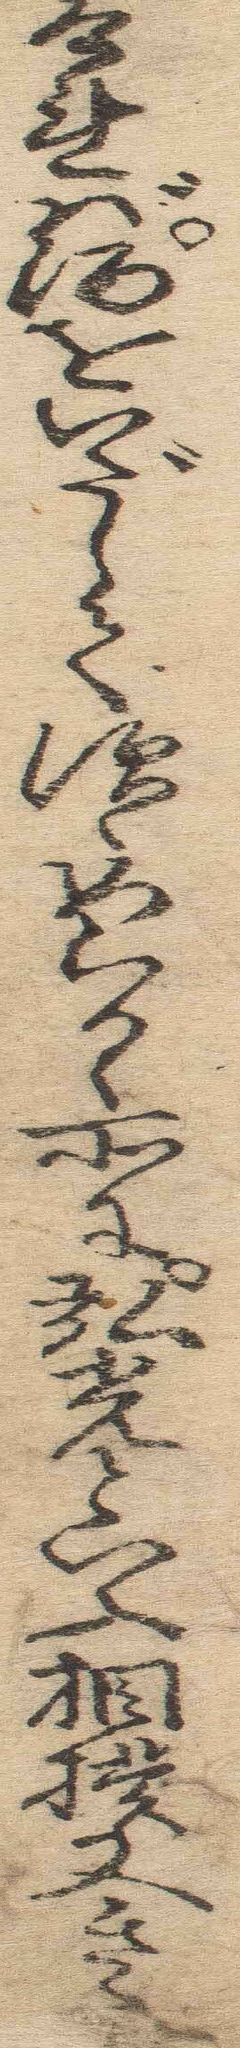ければ。酒をいだしてすゝめらるゝ所に弘光といふ相撲又きたり
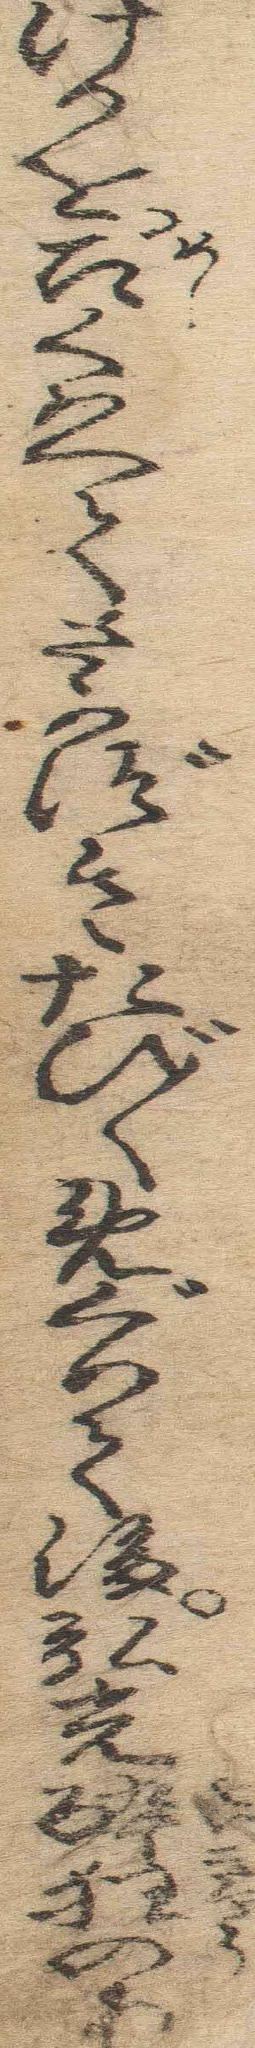けるを。召くはへてさかずきたび〳〵めぐりて後。弘光酔狂のあ

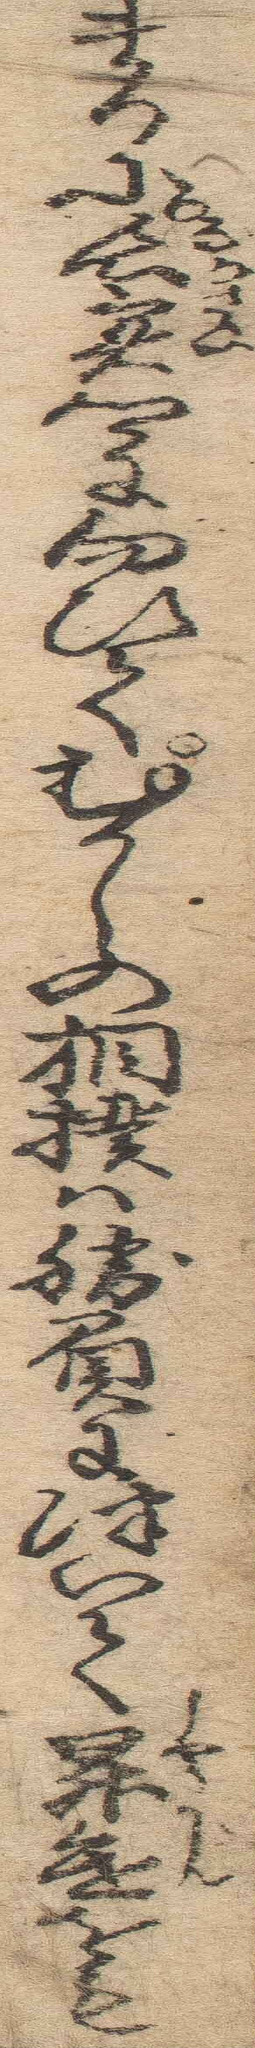まりに。長実卿に向ひて。むかしの相撲は勝負について昇進をも
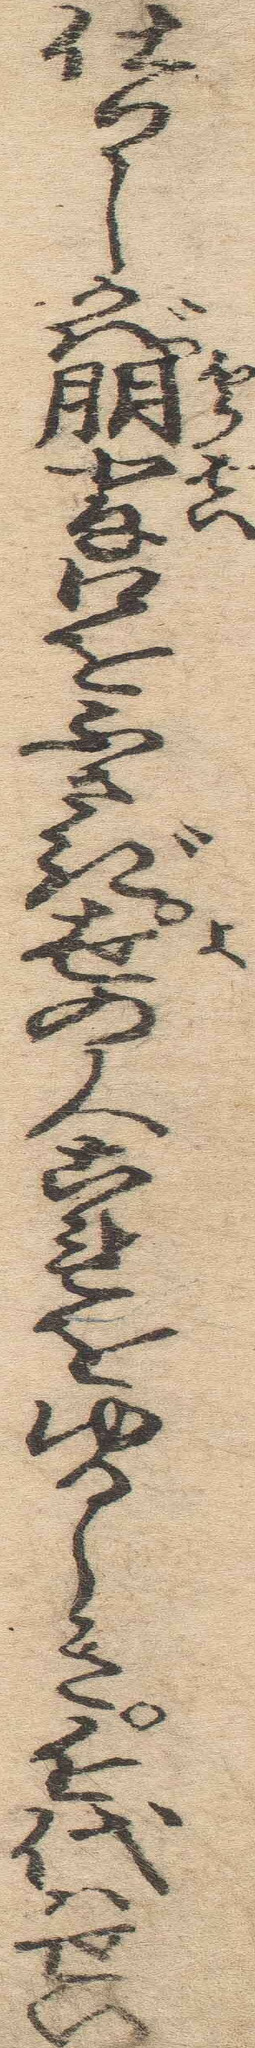仕りしかば。朋輩口をふさぎ。世の人これをゆるしき。近代はせい
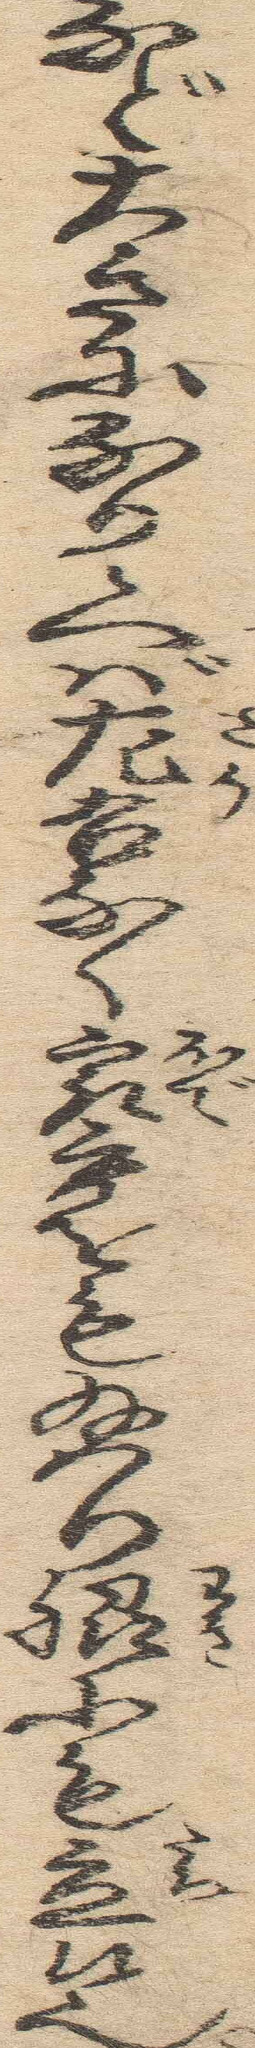など大きになり候へば。左右なく最手をも給はり脇にも立候也。
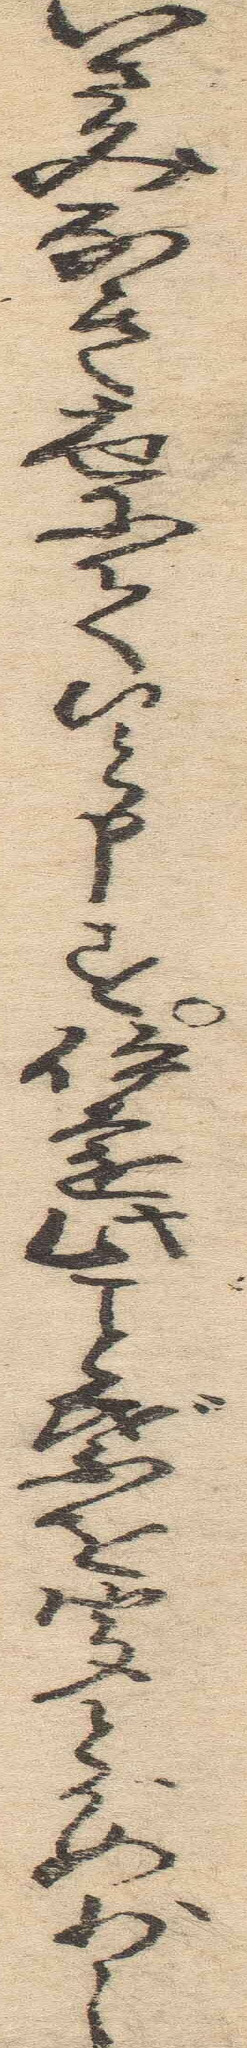いさみなき世にて候と申す。伊遠此こと葉を聞とかめ少し
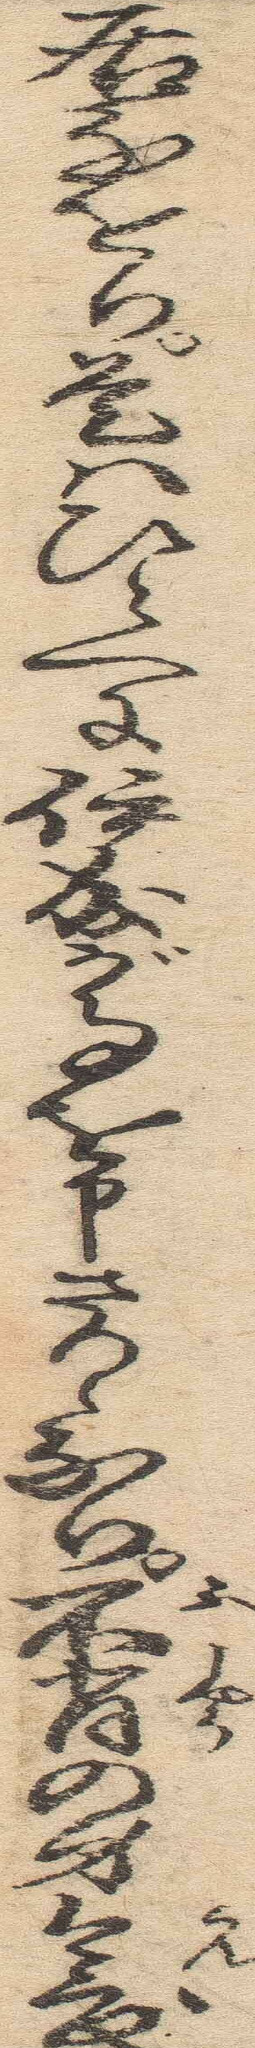居なをり。是はひとへに伊成が事を申たる候なり。不肖の身今度
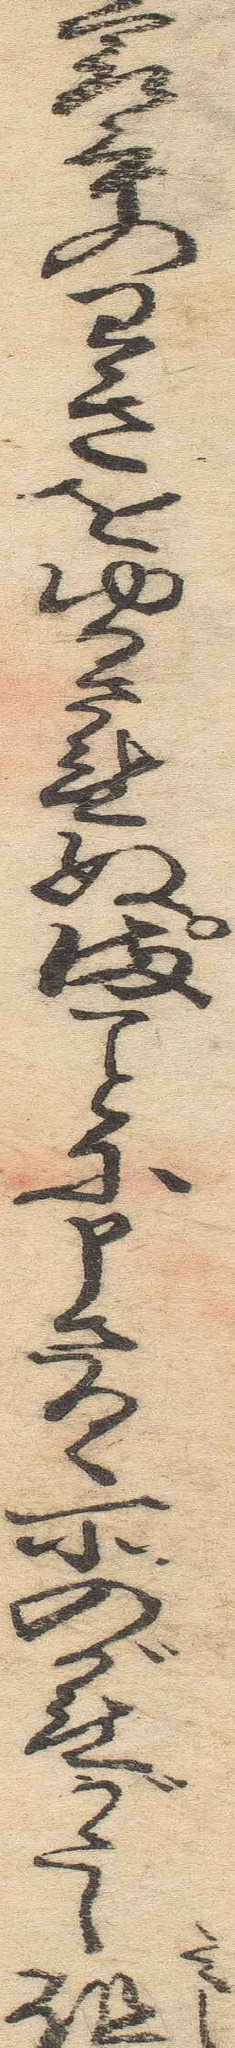最手のわきをゆるされぬ。まことに申さるゝ所のがれがたし。但
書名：古今相撲大全
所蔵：東京学芸大学附属図書館 国文学研究資料館
